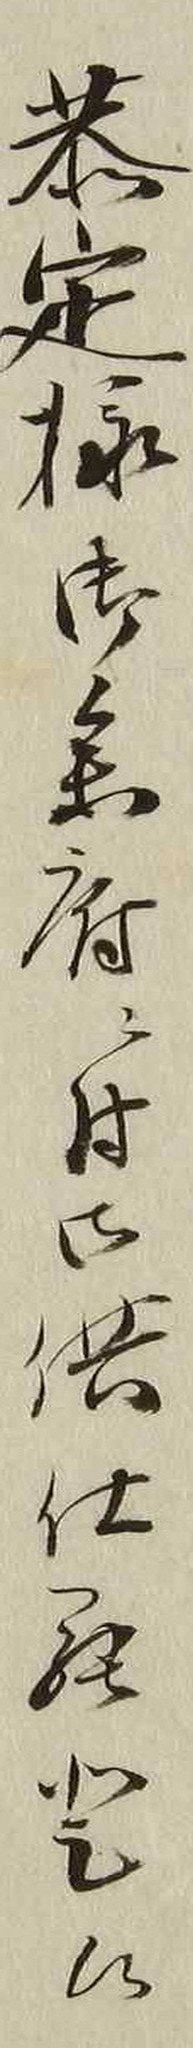恭定様御参府に付御供仕罷登候
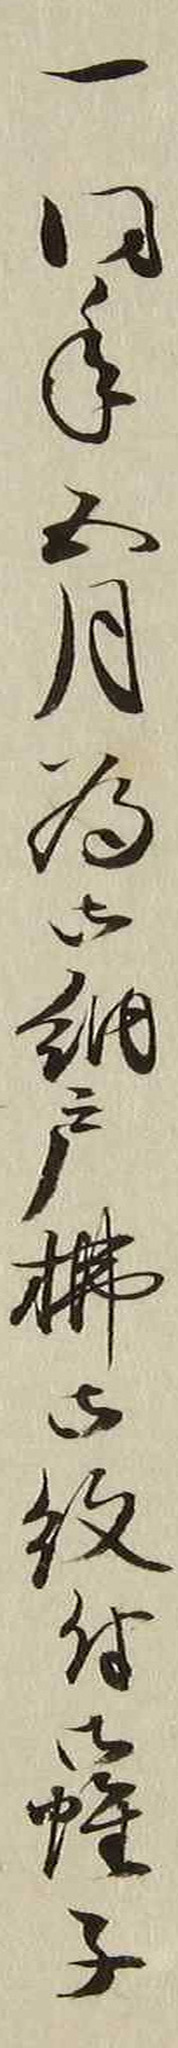一同年五月為御納戸払御紋付御帷子
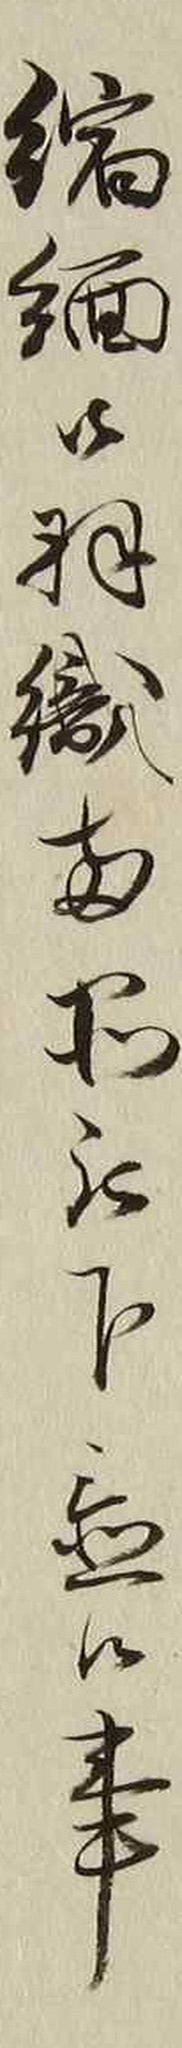縮緬御羽織両品被下置候事
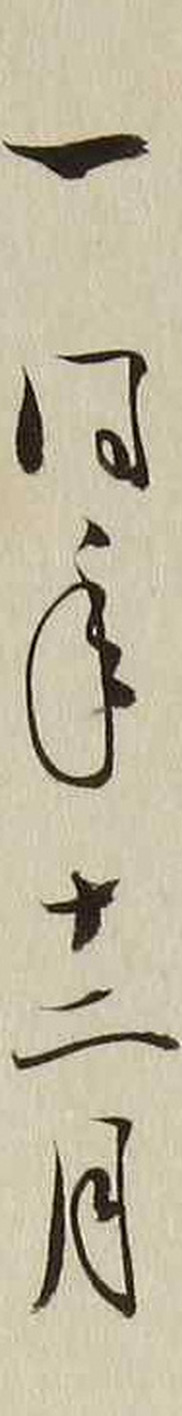一同年十二月
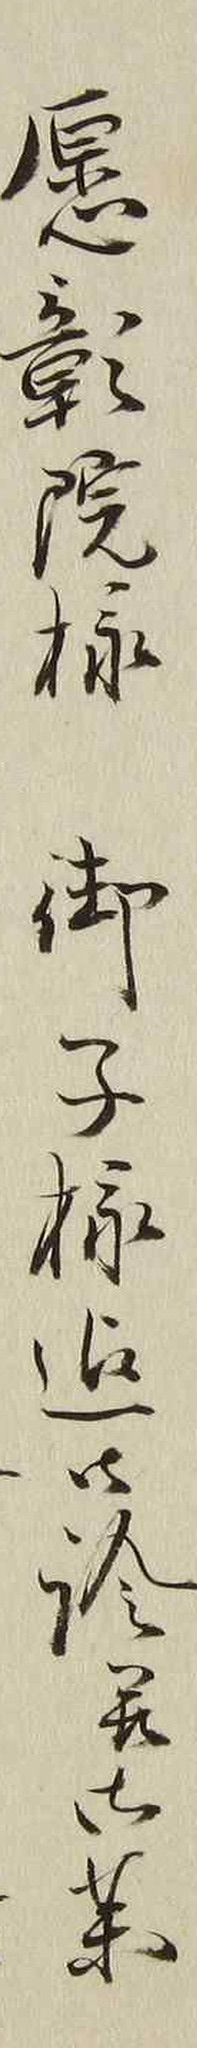愿彰院様御子様迄御診并御薬
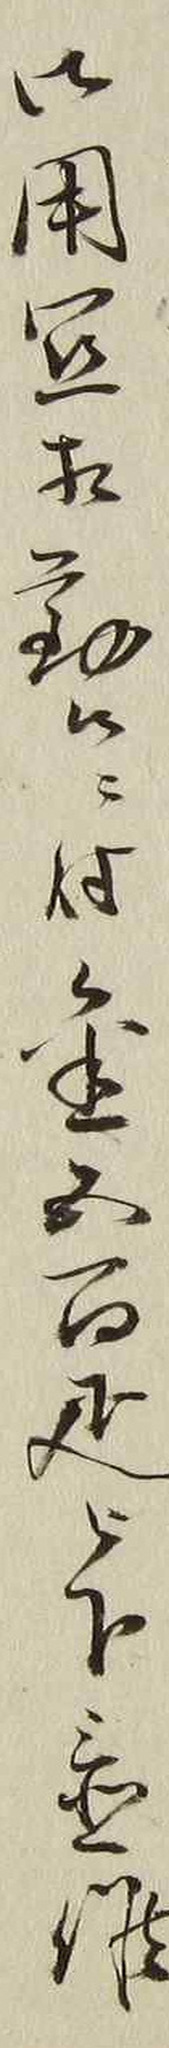御用宜相勤候に付金五百疋被下置候
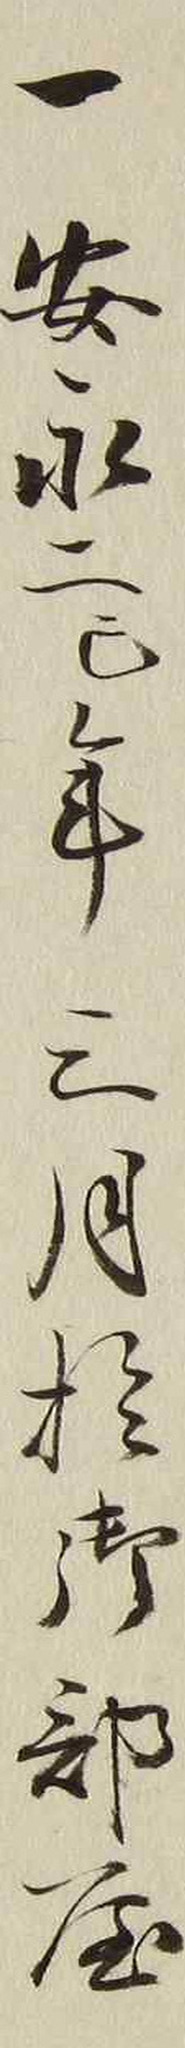一安永二巳年三月於御部屋
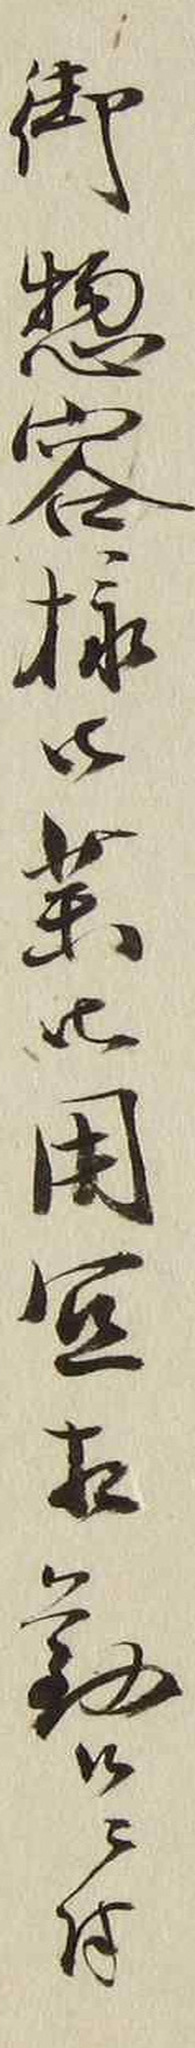御惣容様御薬御用宜相勤候に付
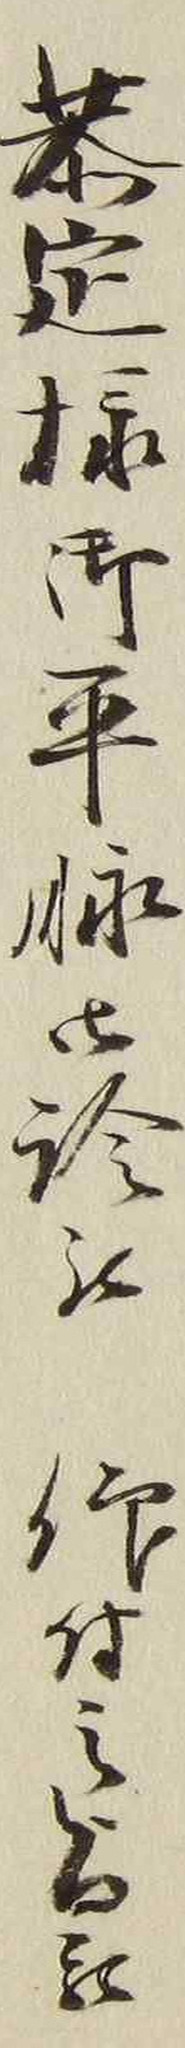恭定様御平脈御診被仰付之旨被
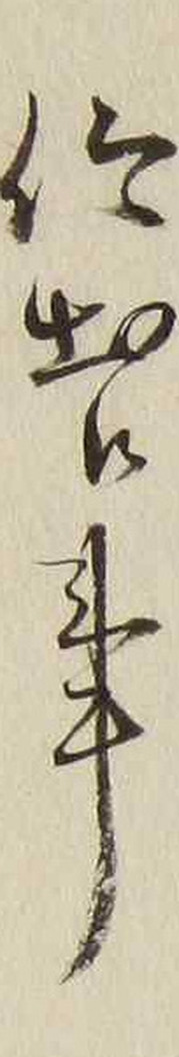仰出候事

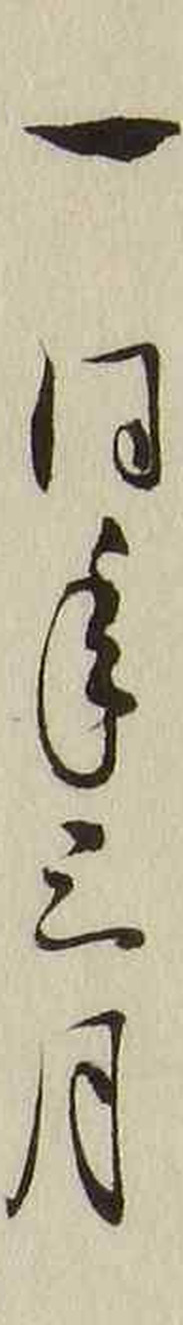一同年三月
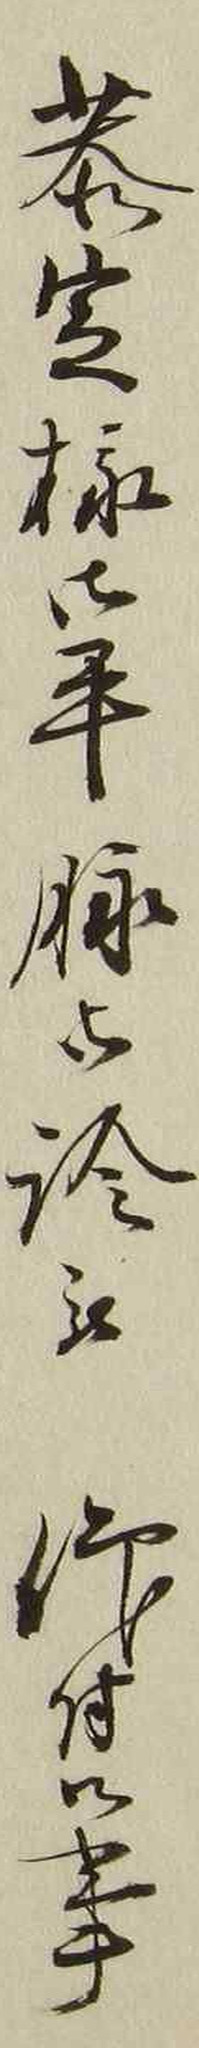恭定様御平脈御診被仰付候事
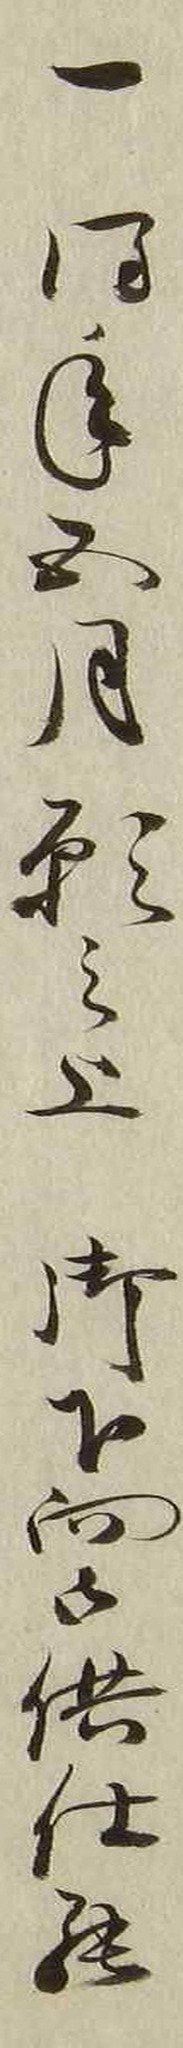一同年五月願之上御下向御供仕罷
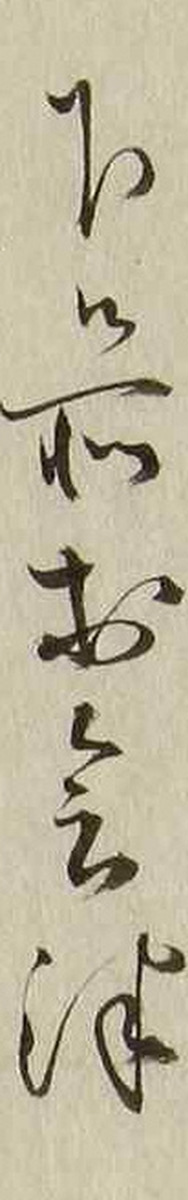下候所於会津
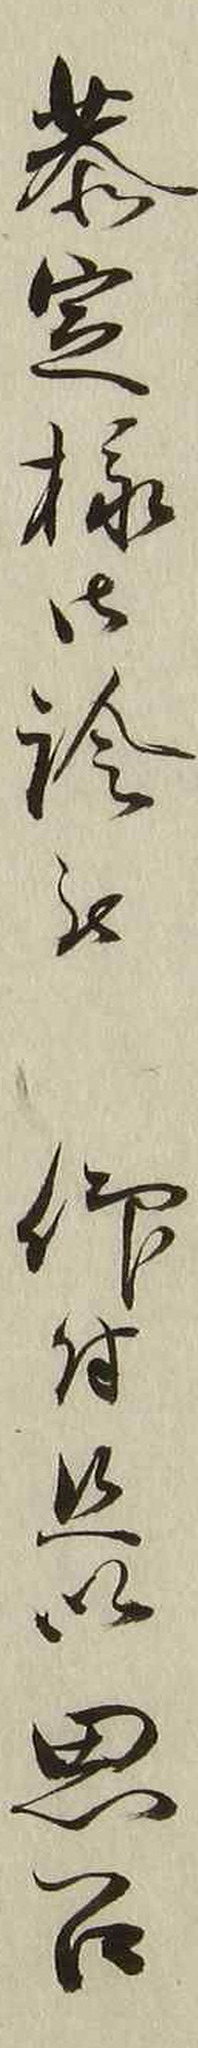恭定様御診被仰付且以思召
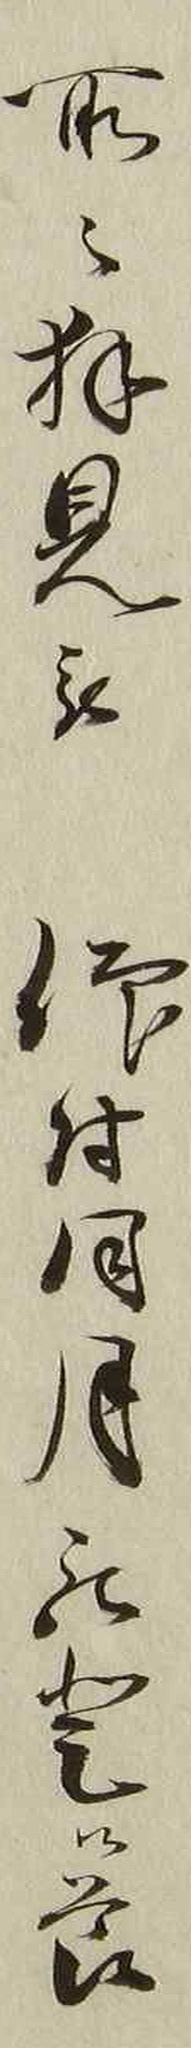所々拝見被仰付同月罷登候節
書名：諸士系譜　巻之157　ね之部1
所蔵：会津若松市立会津図書館
